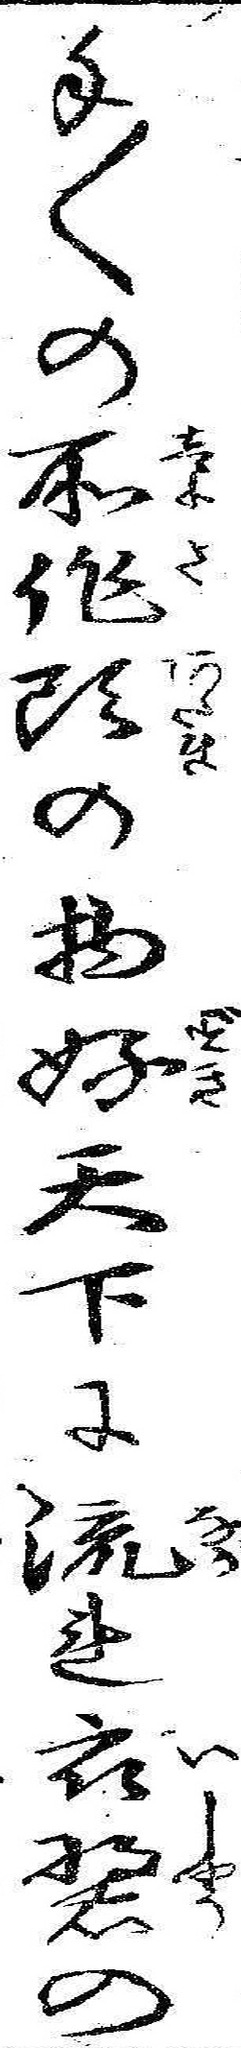手〱の所作頭の物好天下に流れ衣装の
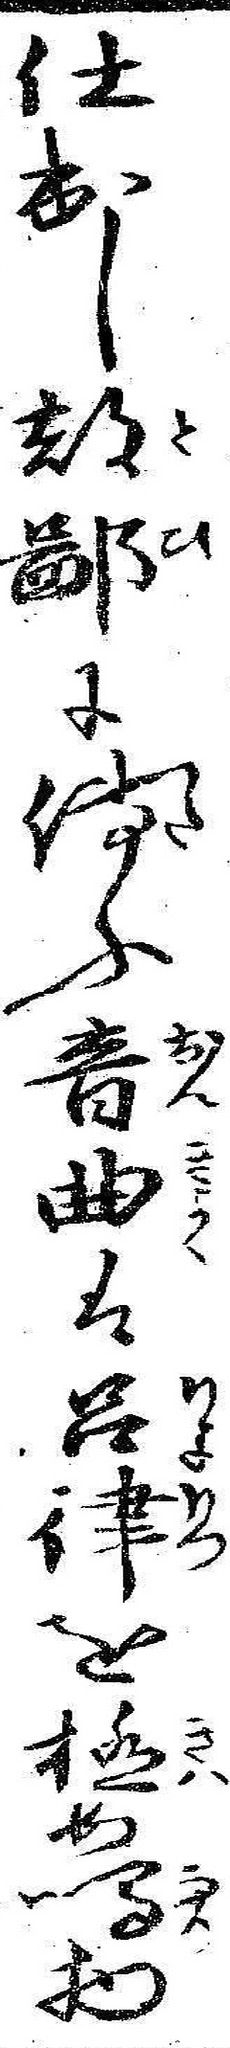仕出し都鄙に伝ふ音曲は呂律を極め鳴物

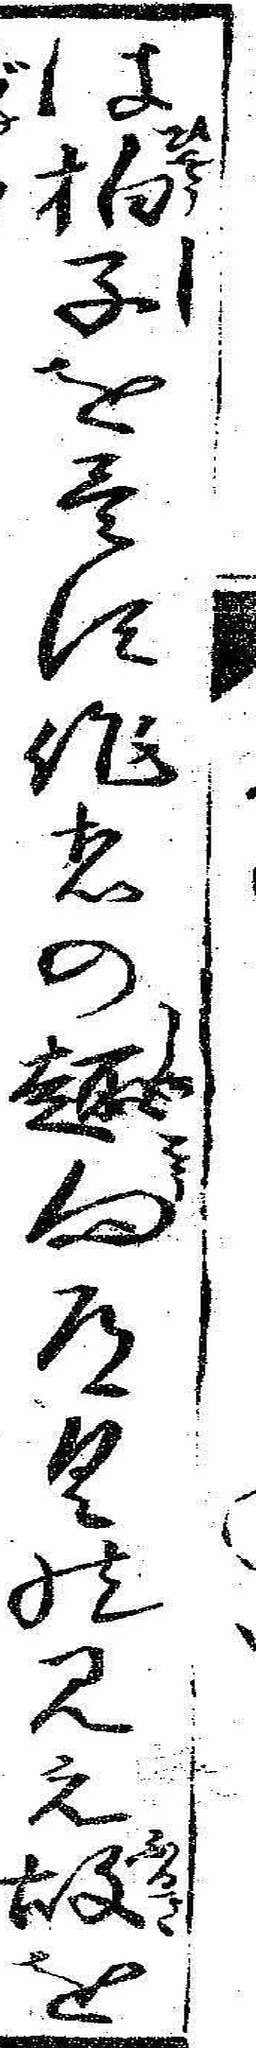は柏子を尽す作者の趣向道具の見え故を
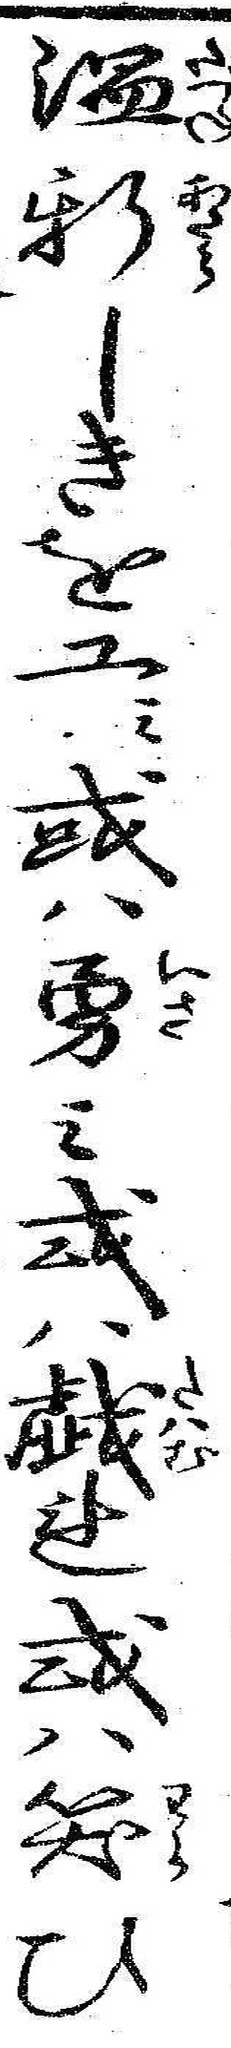温新しきを工或は勇み或は戯れ或は笑ひ
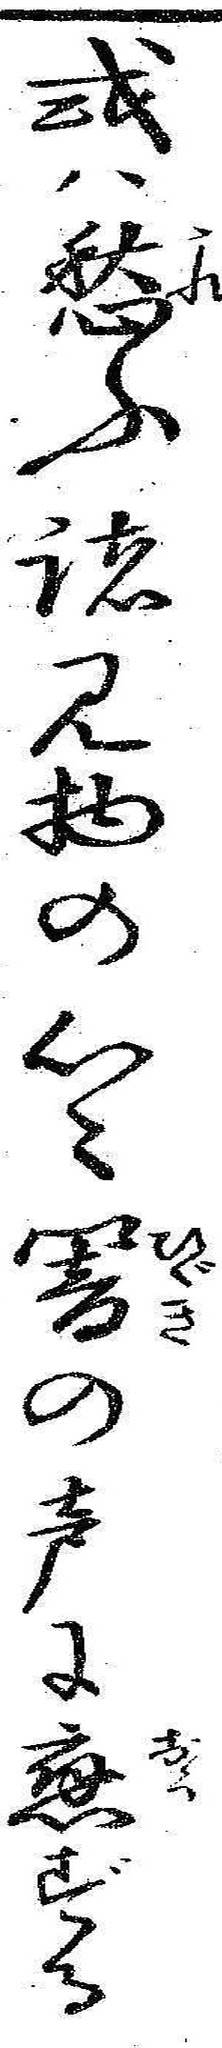或は愁ふ諸見物の心々響の声に応ずる
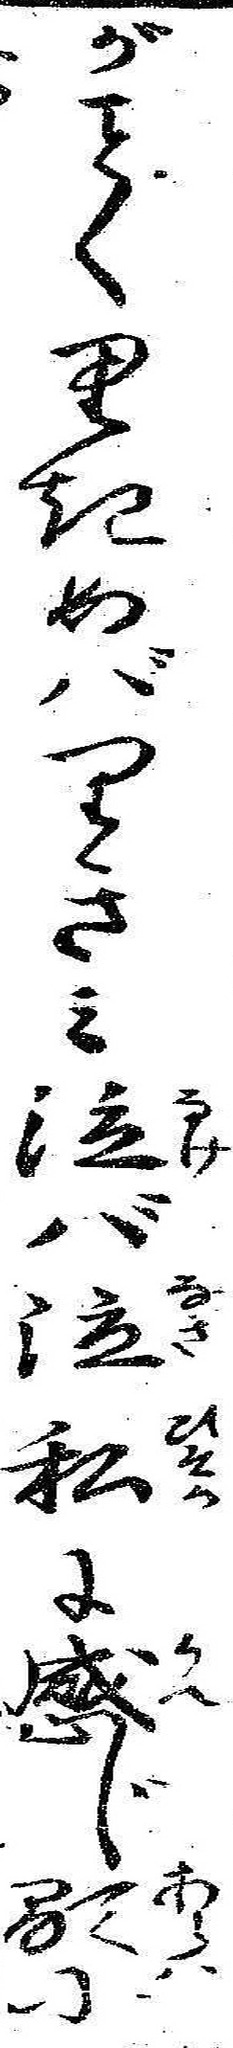がことくりきめばりきみ泣ば泣私に感じ顕に
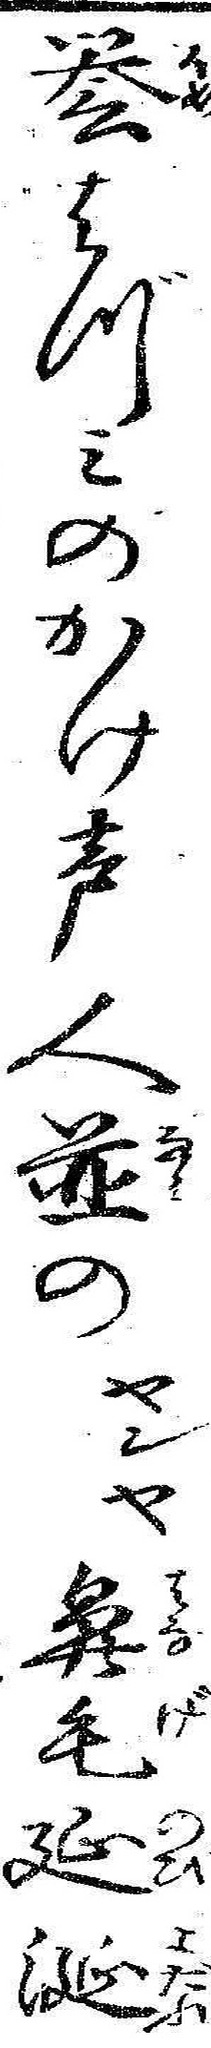誉はづみのかけ声人並の鼻毛延涎
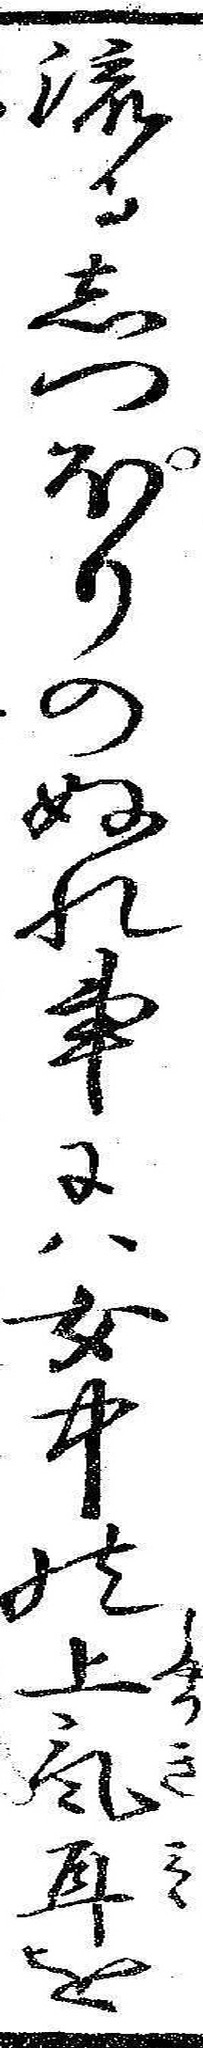流るしつぽりのぬれ事には女中の上気耳を
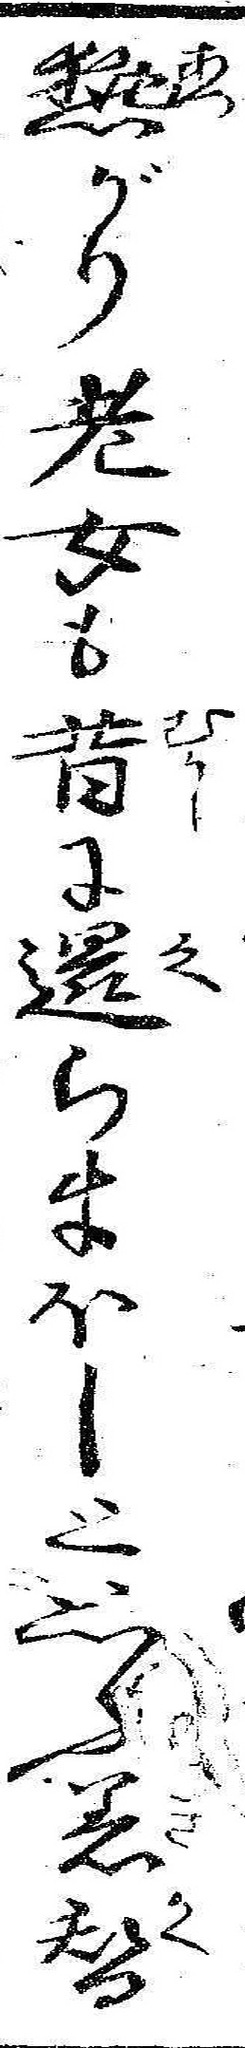熱がり老女も昔に還らまほしと思ふ着替
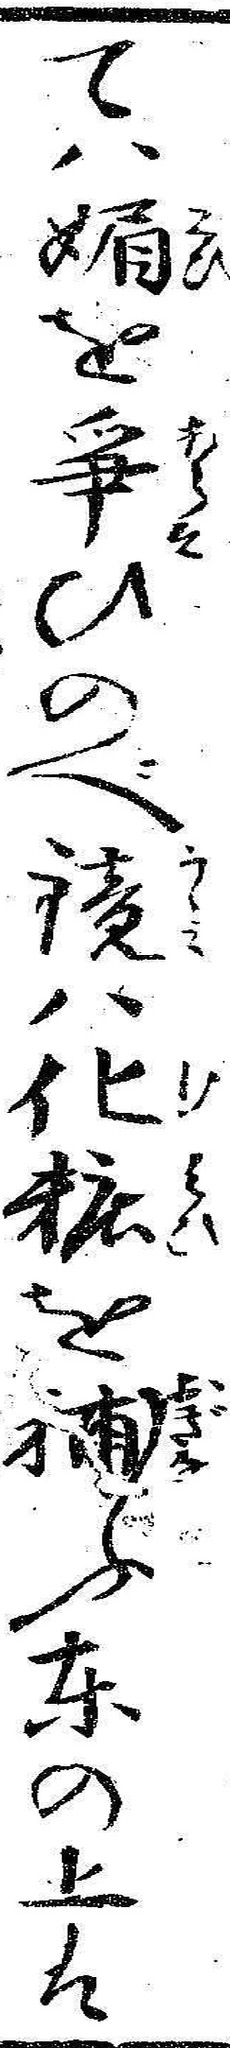ては媚を争ひのべ鏡は化粧を補ふ東の上は
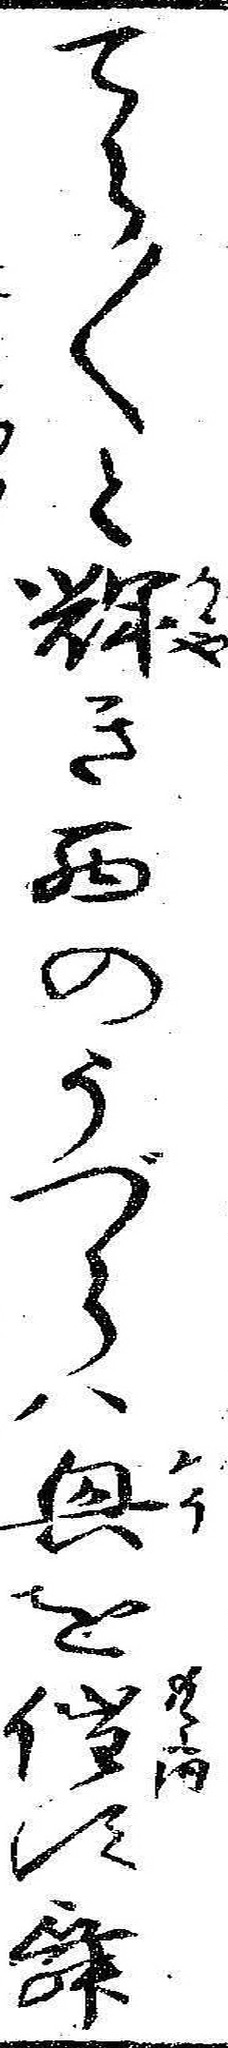てら〱と輝き西のうづらは興を催す舞
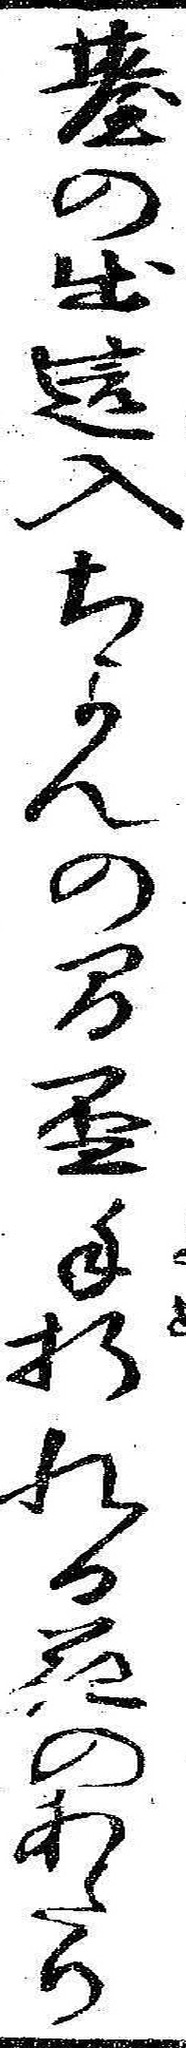台の出這入ちよんの間盃手折れる花のあたり
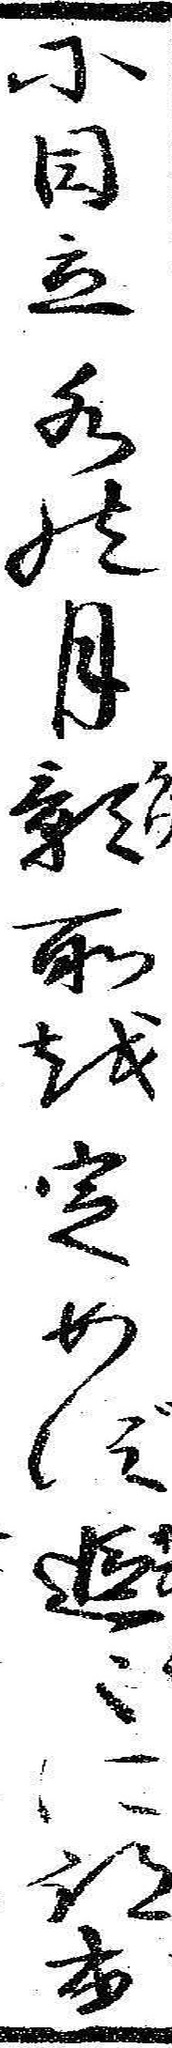に目立水の月影所を定めず追々に跡出
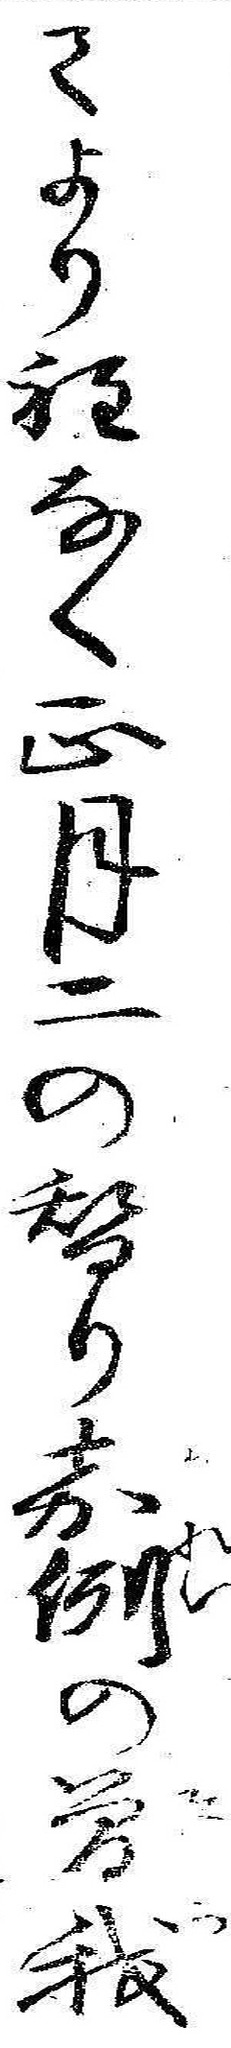てより程なく正月二の替り嘉例の曽我
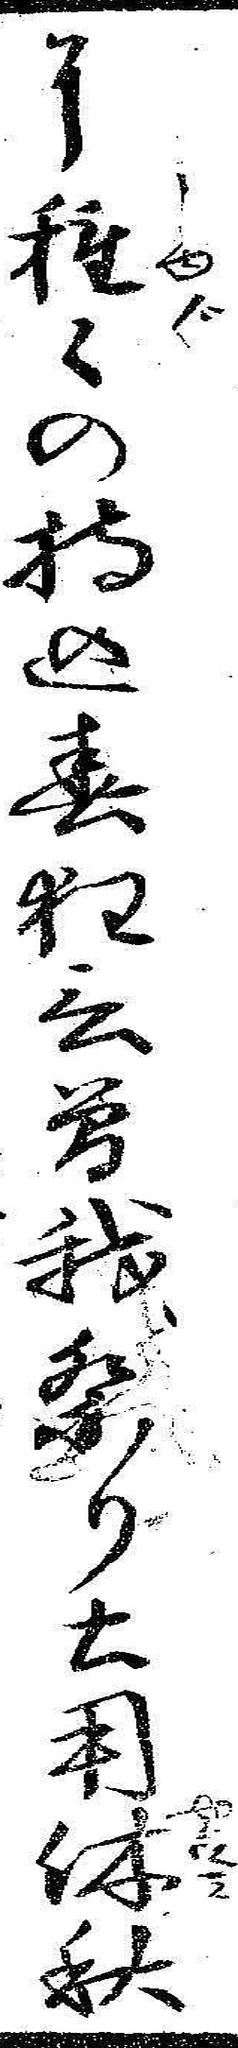に種々の持込春狂言曽我祭り土用休秋
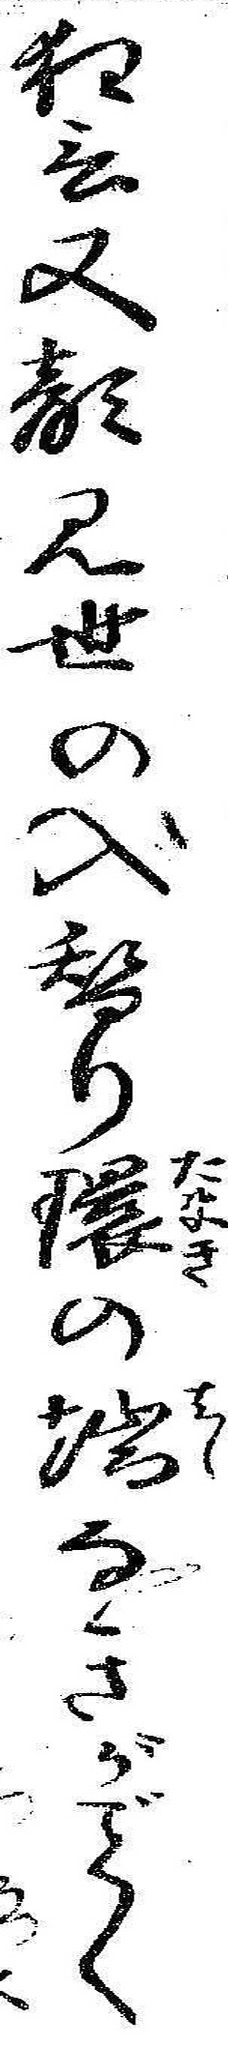狂言又顔見世の入替り環の端なきがごとく
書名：根無草後編
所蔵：国文学研究資料館
